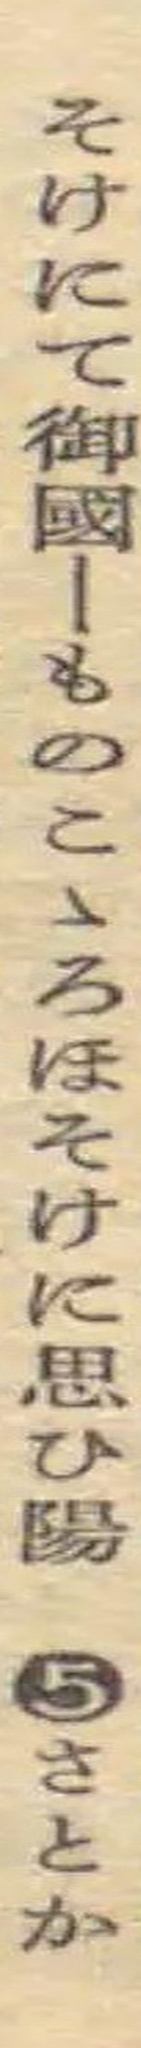そけにて御国―ものこゝろほそけに思ひ陽❺さとか
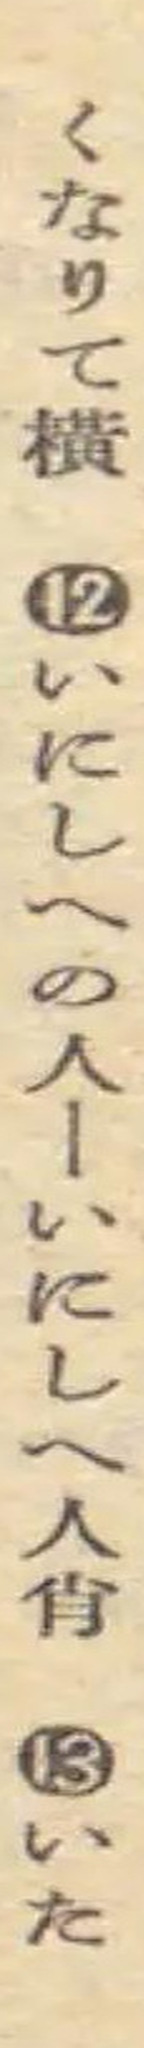くなりて横⓬いにしへの人―いにしへ人肖⓭いた
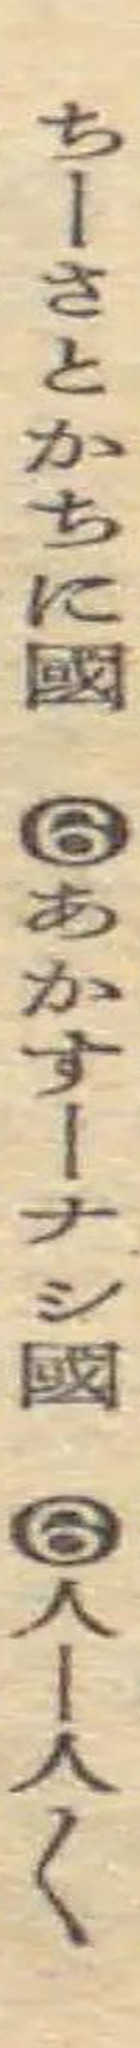ち―さとかちに国❻あかす―ナシ国❻人―人〳〵
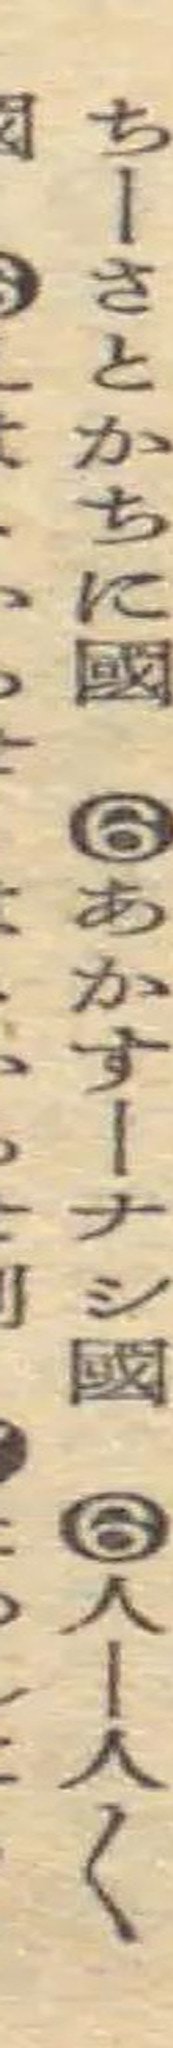ち―さとかちに国❻あかす―ナシ国❻人―人〳〵
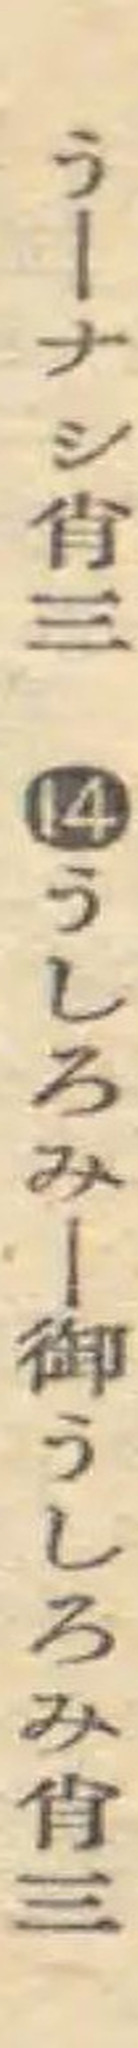う―ナシ肖三⓮うしろみ―御うしろみ肖三
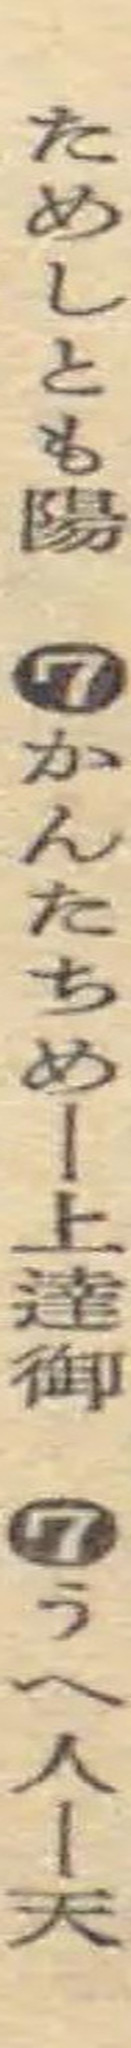ためしとも陽❼かんたちめ―上達御❼うへ人―天
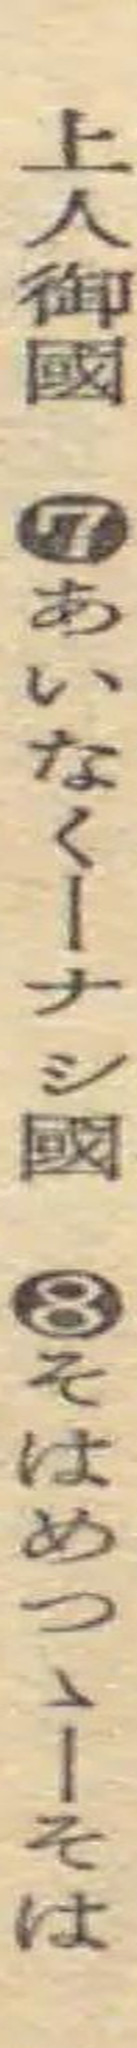上人御国❼あいなく―ナシ国❽そあめつゝ―そは
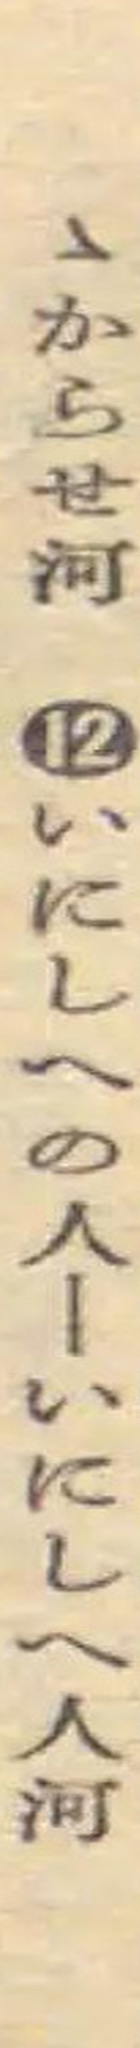ゝからせ河⓬いにしへの人―いにしへ人河
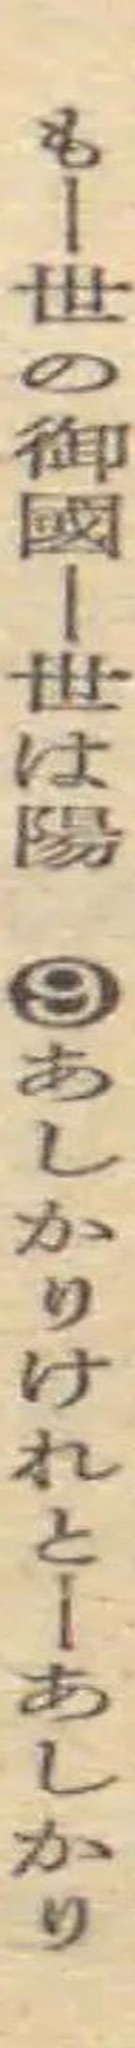も―世の御国―世は陽❾あしかりけれと―あしかり
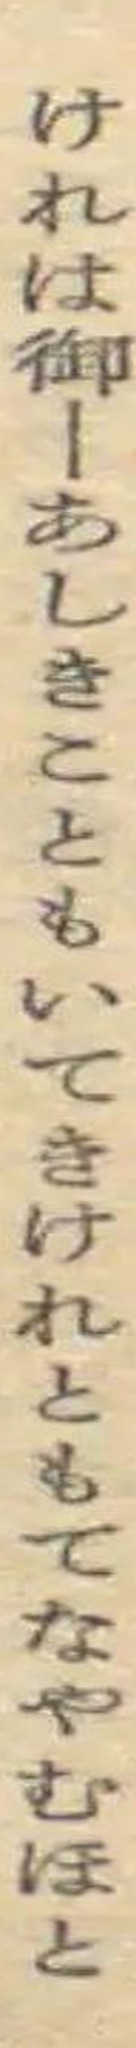けれは御―あしきこともいてきけれともてなやむほと
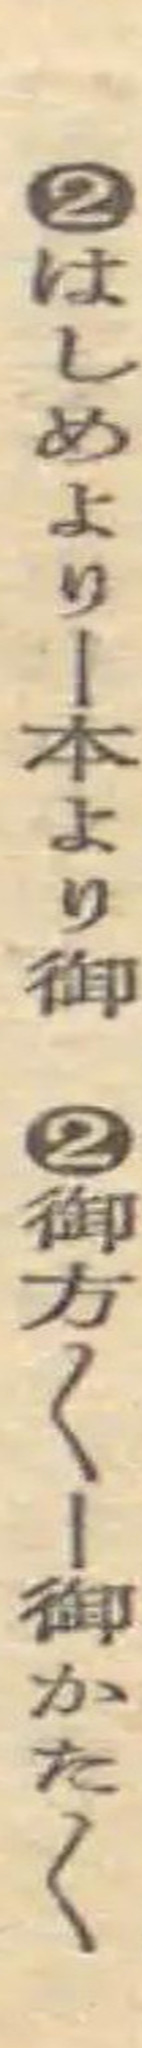➋はしめより―本より御➋御方〳〵―御かた〳〵
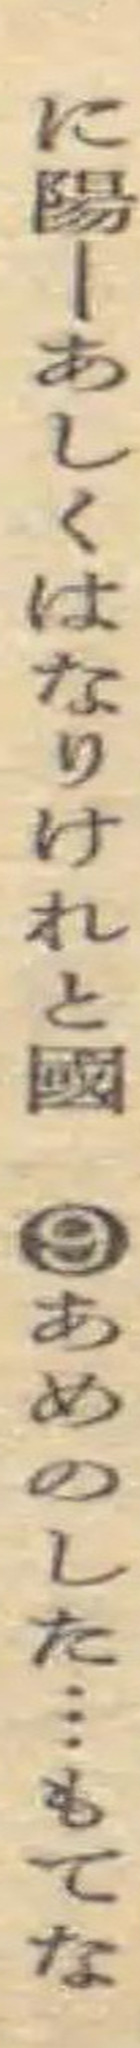に陽―あしくはなりけれと国❾あめのした…もてな

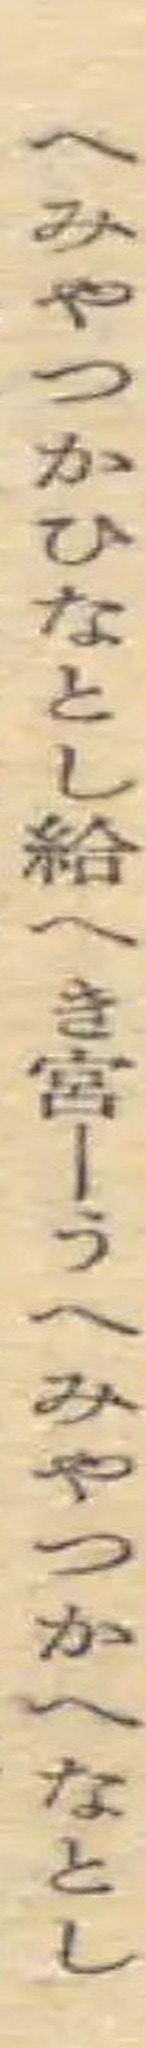へみやつかひなとし給へき宮―うへみやつかへなとし
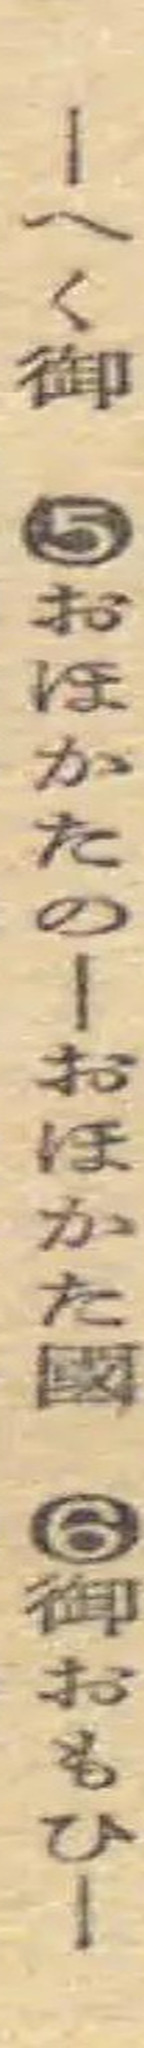―へく御❺おほかたの―おほかた国❻御おもひ―
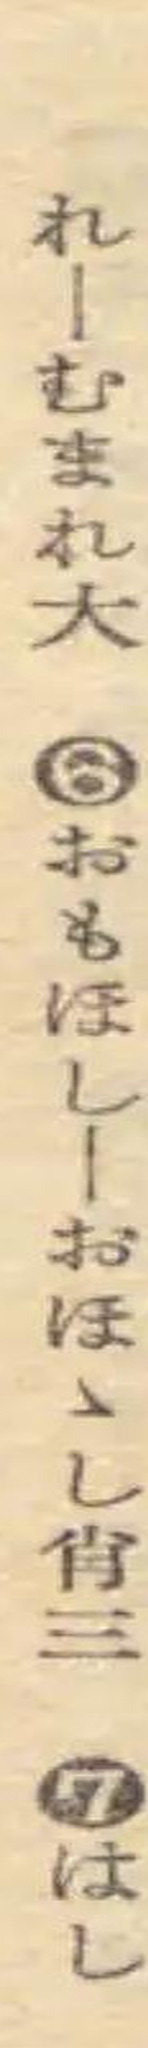れ―むまれ大❻おもほし―おほゝし肖三❼はし
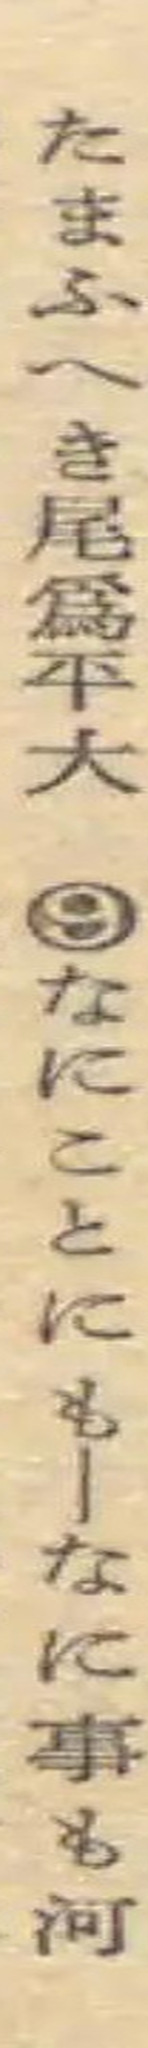たまふへき尾為平大❾なにことにも―なに事も河
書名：校異源氏物語.
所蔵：国立国会図書館 National Diet Library, JAPAN
